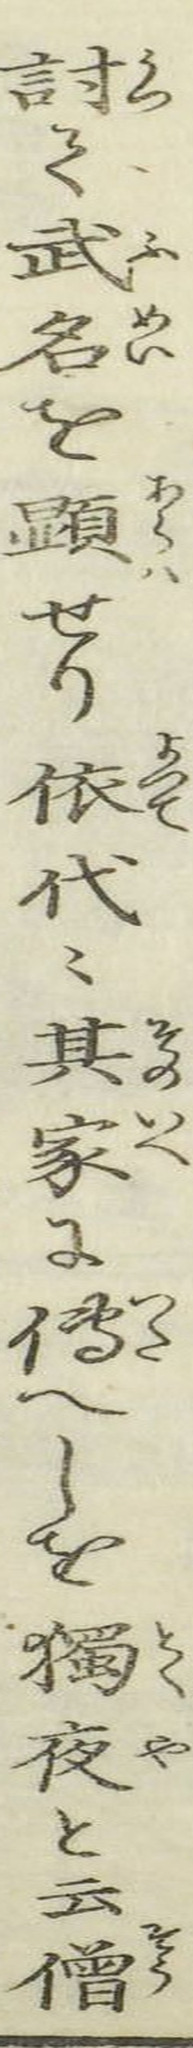討て武名を顕せり依代々其家に傳へしを獨夜と云僧
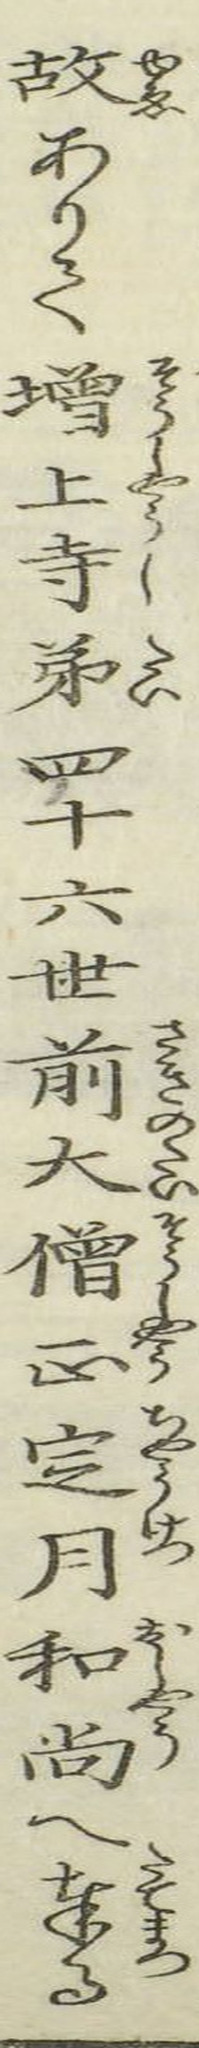故ありて増上寺第四十六世前大僧正定月和尚へ奉る
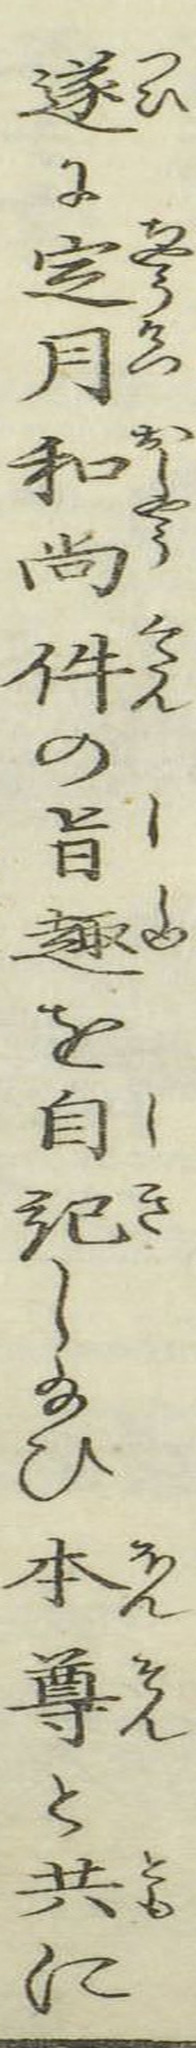遂に定月和尚件の旨趣を自記し給ひ本尊と共に
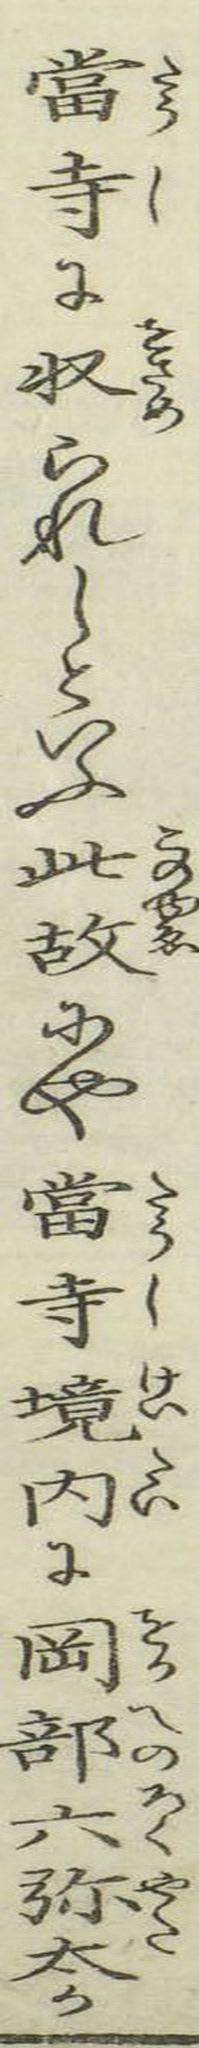當寺に収られしといふ此故にや當寺境内に岡部六弥太か
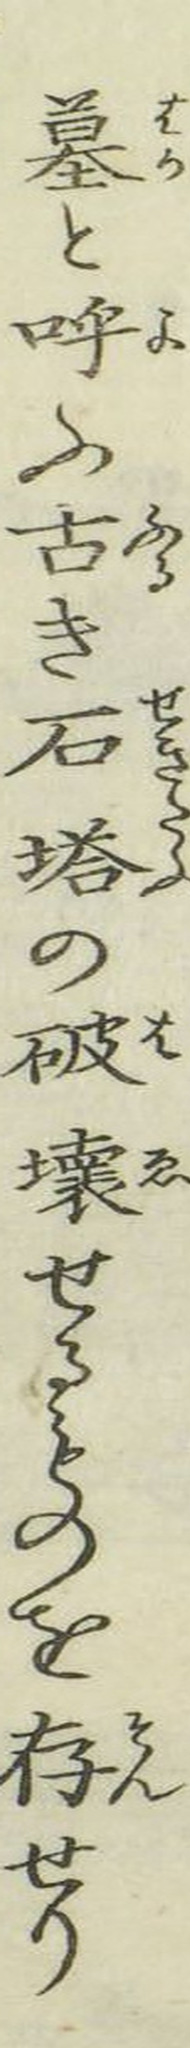墓と呼ふ古き石塔の破壊せるものを存せり
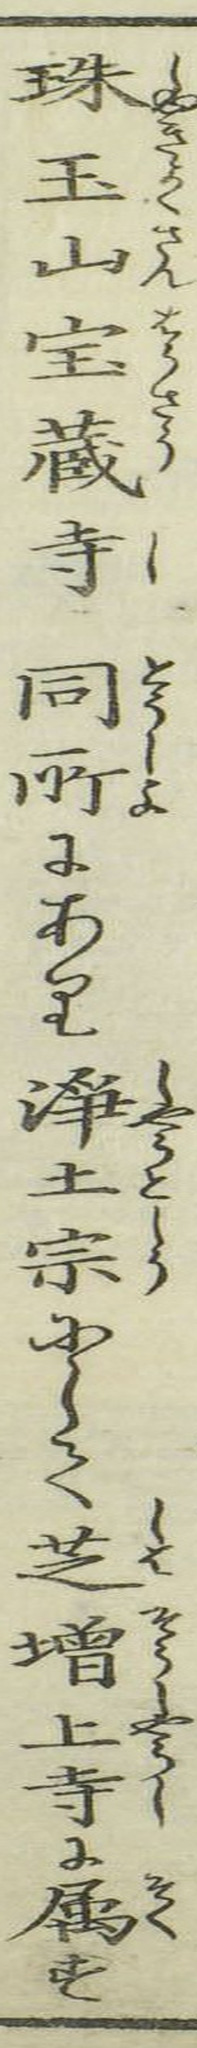珠玉山宝蔵寺同所にあり浄土宗にして芝増上寺に属す

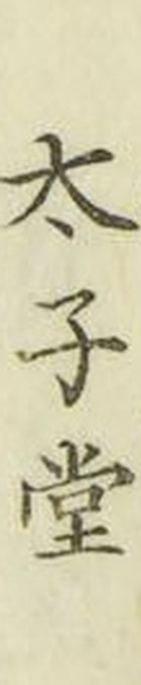太子堂
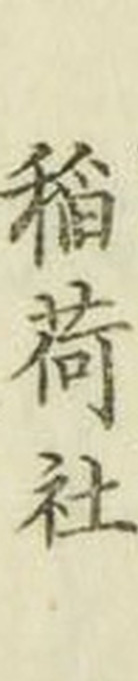稲荷社
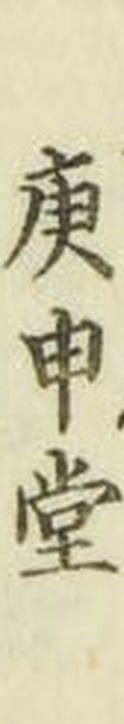庚申堂
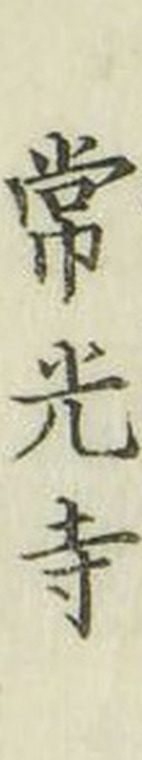常光寺

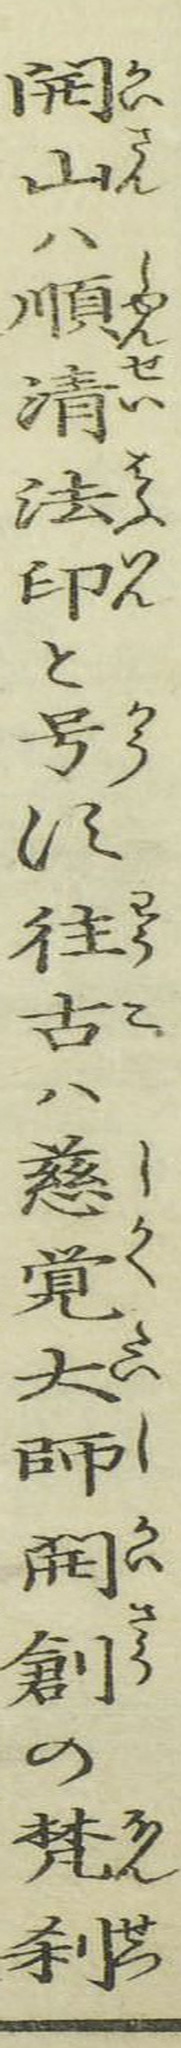開山は順清法印と号す往古は慈覚大師開創の梵刹
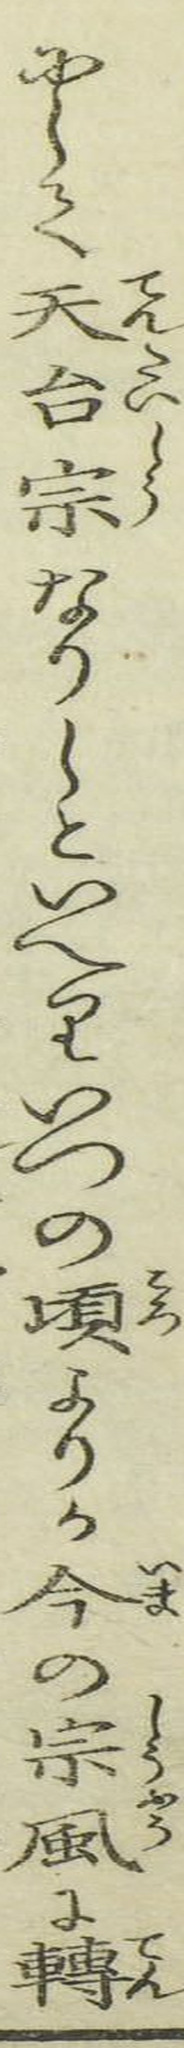にして天台宗なりしといへりいつの頃よりか今の宗風に轉
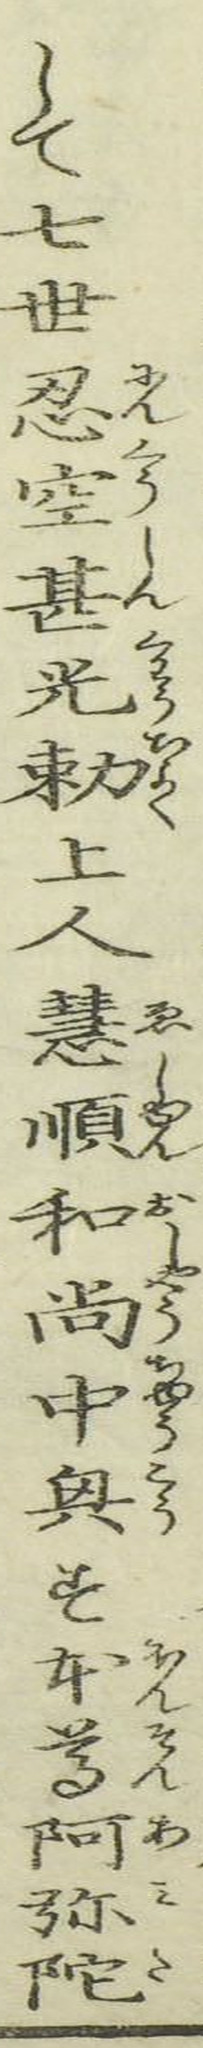して七世忍空甚光勅上人慧順和尚中興す本尊阿弥陀
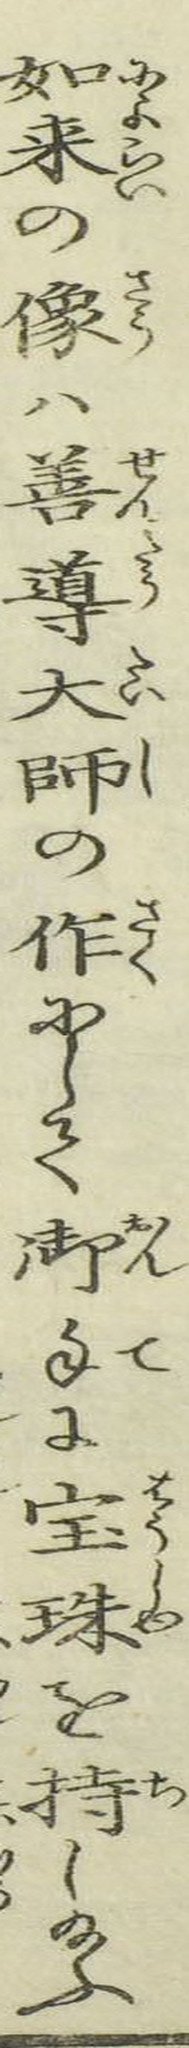如来の像は善導大師の作にして御手に宝珠を持し給ふ
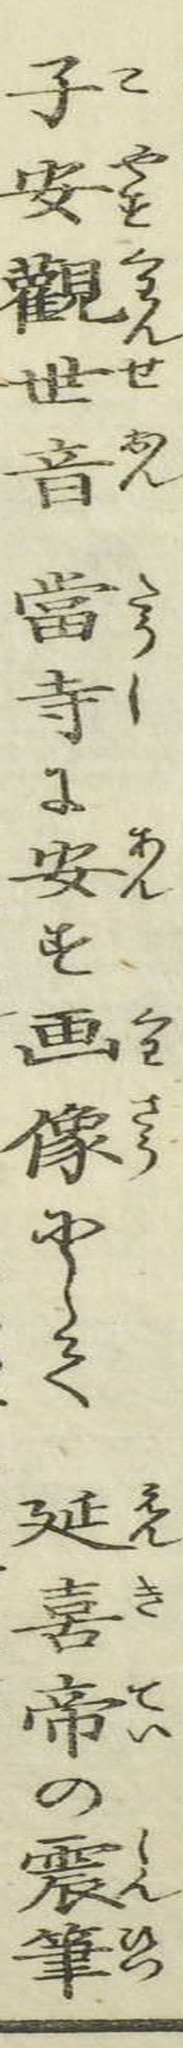子安観世音當寺に安す画像にして延喜帝の震筆
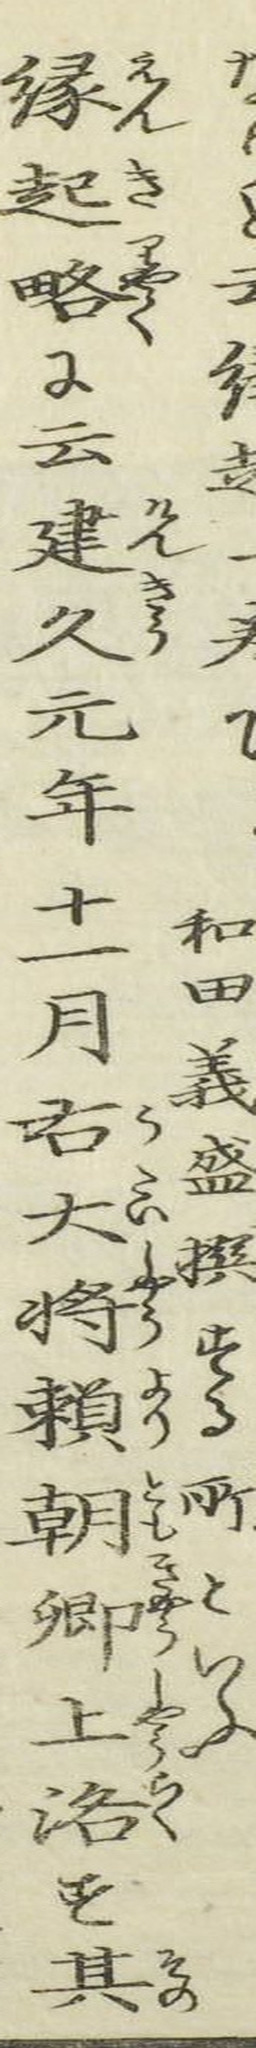縁起略に云建久元年十一月右大将頼朝卿上洛す其
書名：江戸名所図会 20巻 巻之3
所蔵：東京学芸大学教育コンテンツアーカイブ
